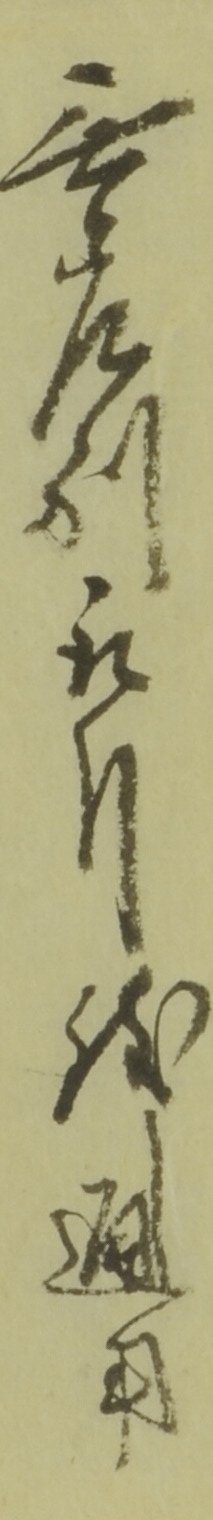無差別被引致し通用
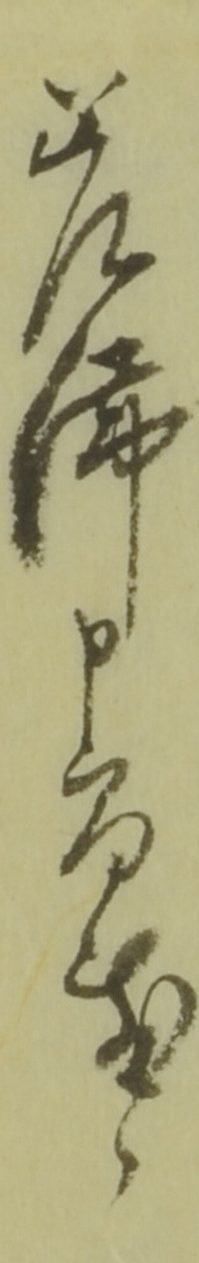差滞申間敷候
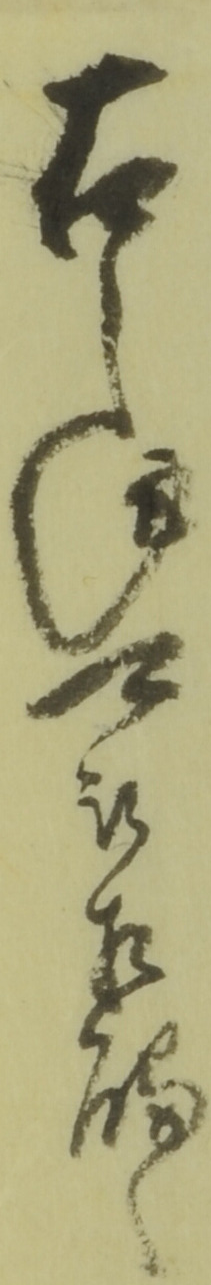右之趣可被相触候
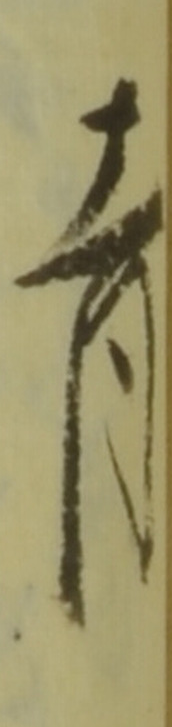十一月
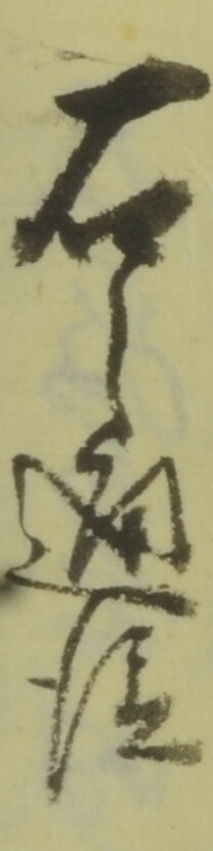右之通従
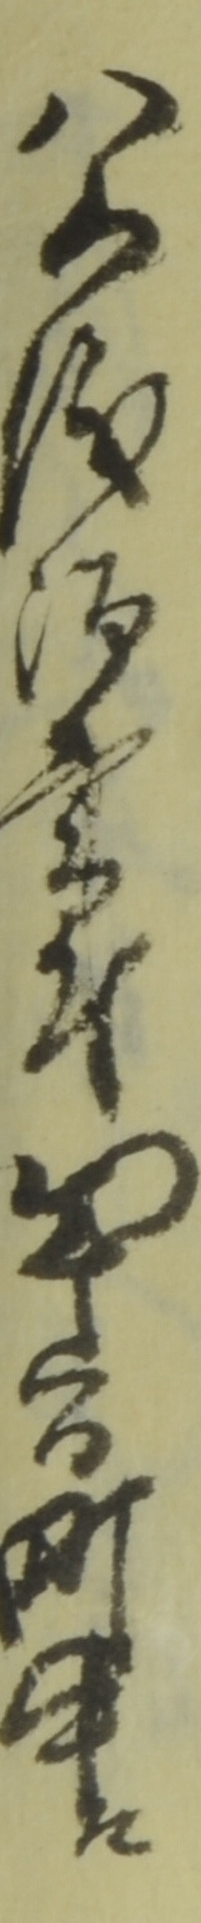公儀御書付出候間町中江

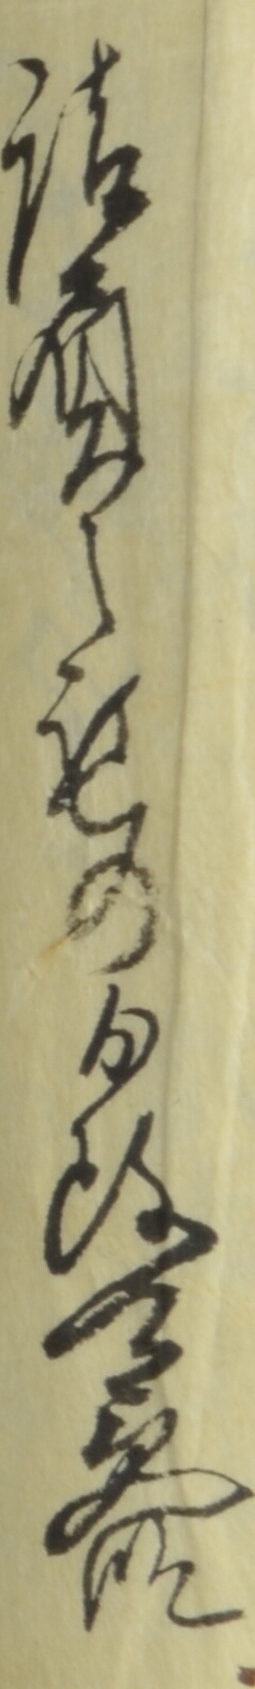請負之ものゟ改可受明
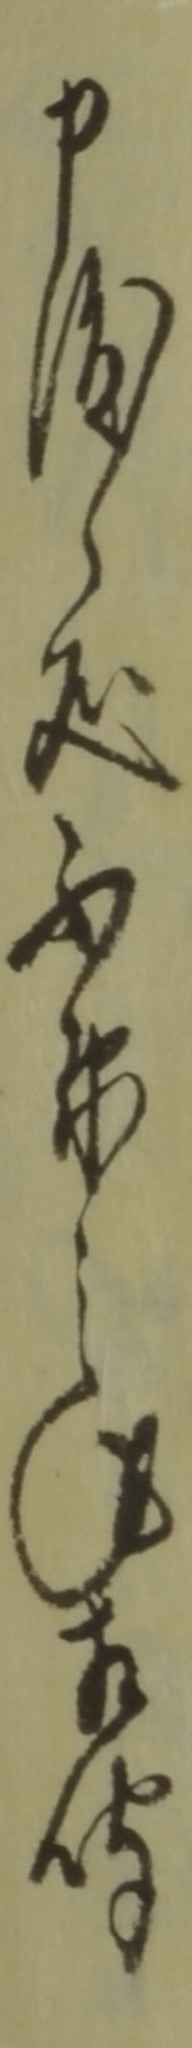申渡候処不束之趣相聞
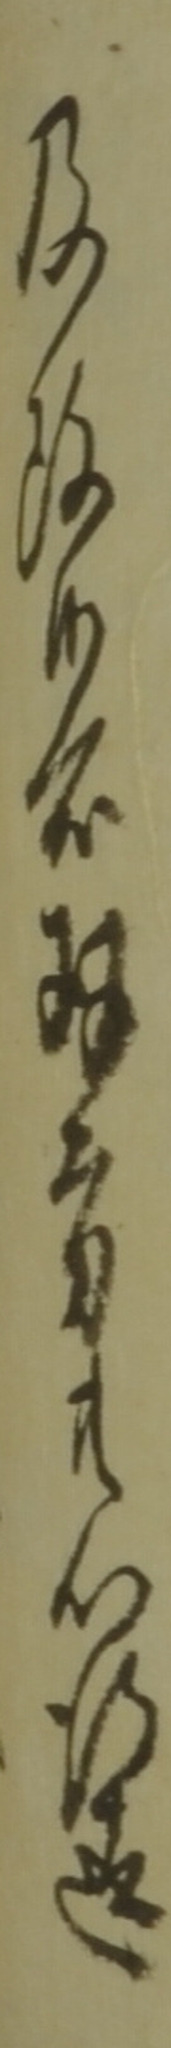及改候双方共心得違
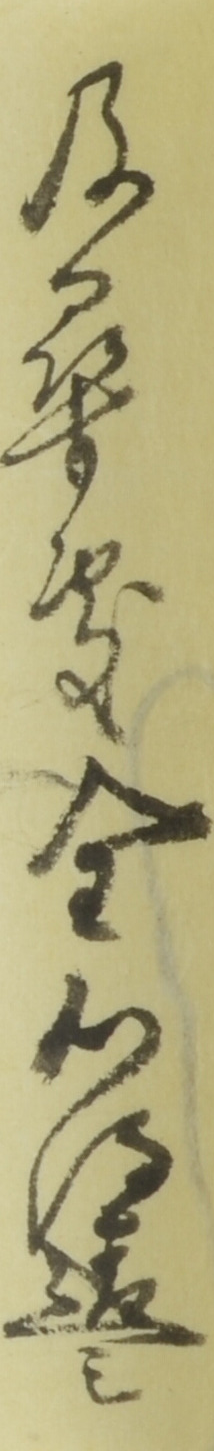及尋敷全心得違之
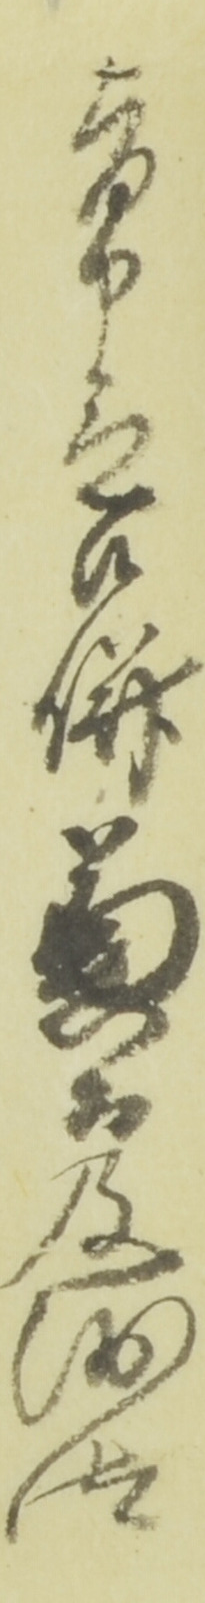旨申立候済兼而及沙汰
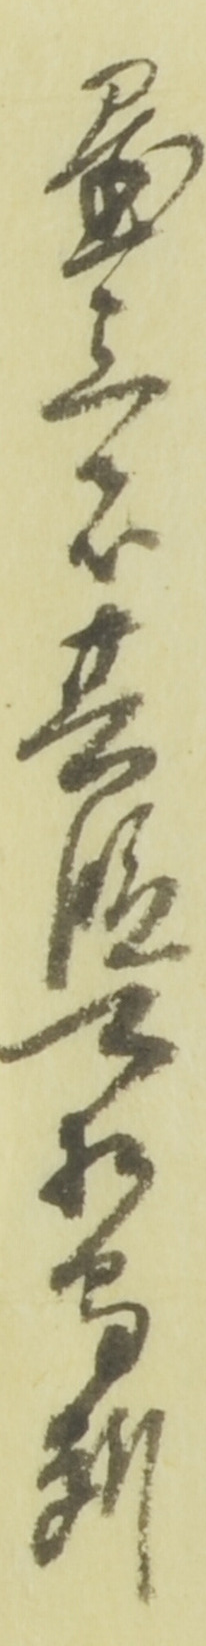置上は其段可相守所
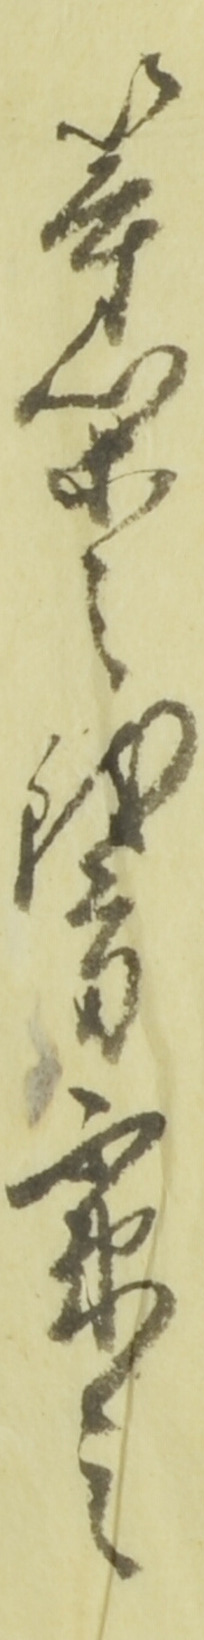等閑之致方不束之
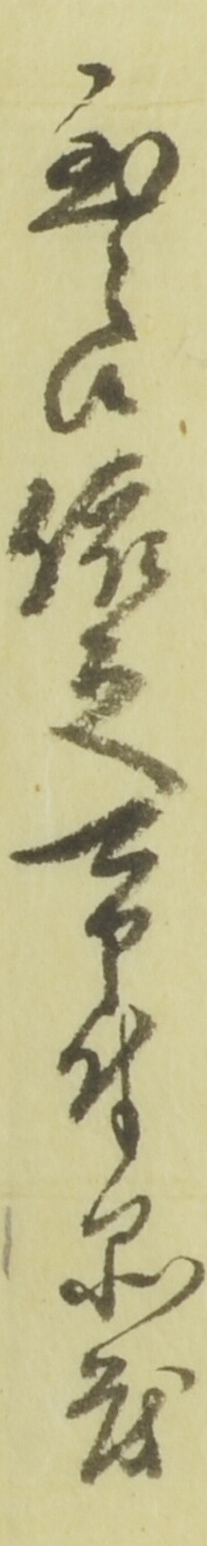至之候依之可申付品も
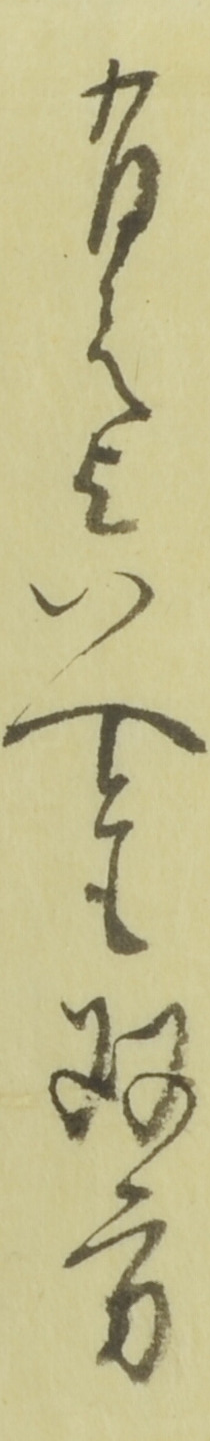有之といへとも双方
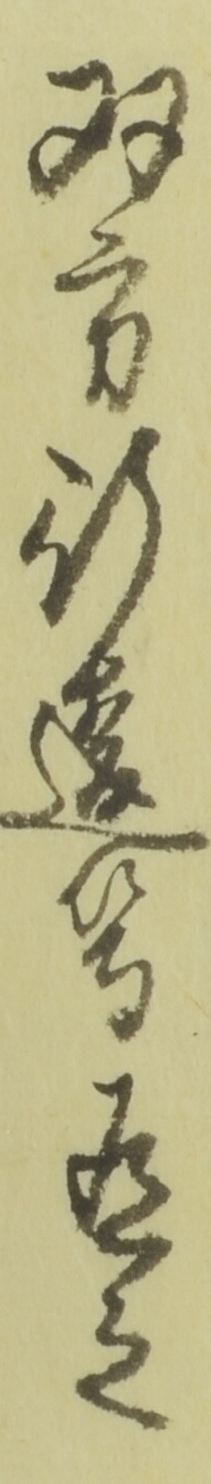双方行違等有之
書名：御触書御書附控
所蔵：伊那市立高遠町図書館・合同会社AMANE
